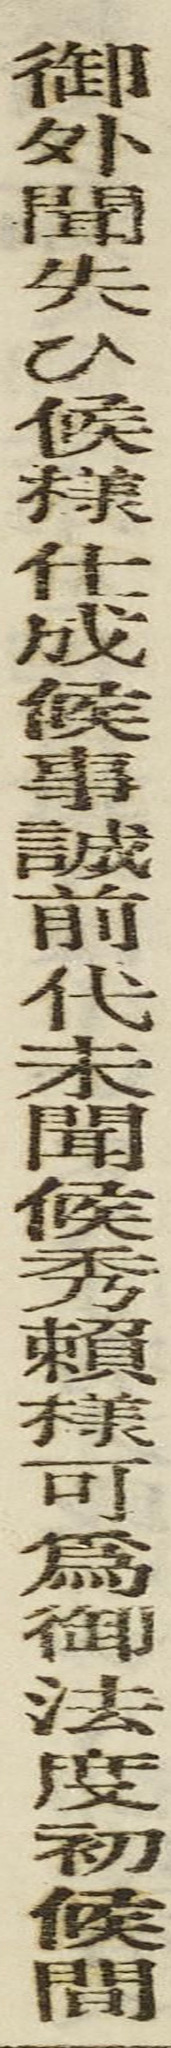御外聞失ひ候樣仕成候事誠前代未聞候秀頼様可為御法度初候間
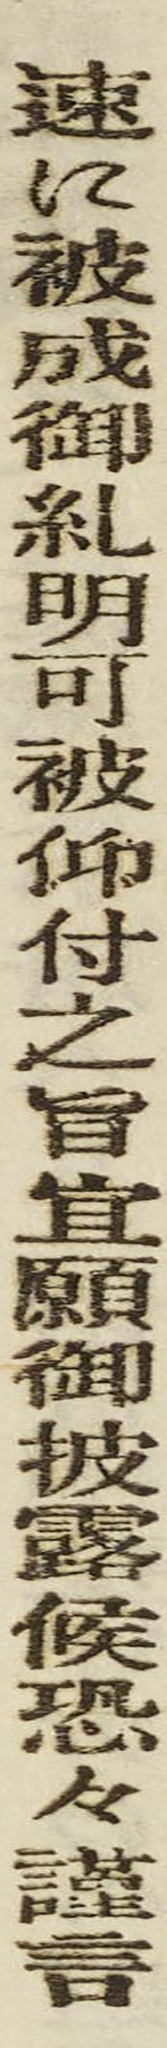速に被成御糺明可被仰付之旨宣願御披露候恐々謹言
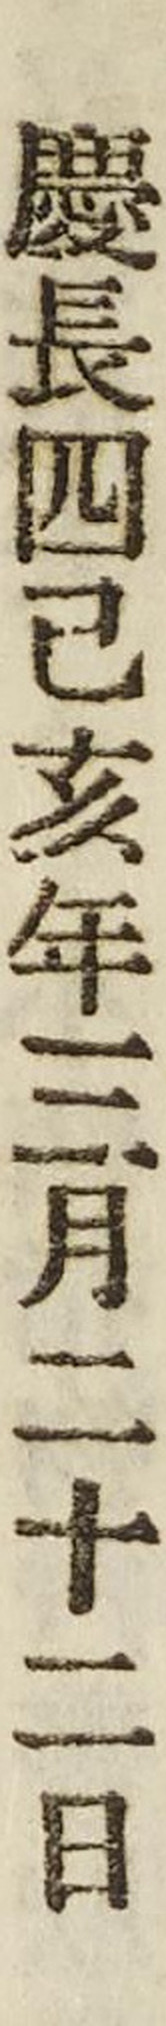慶長四己亥年三月二十二日
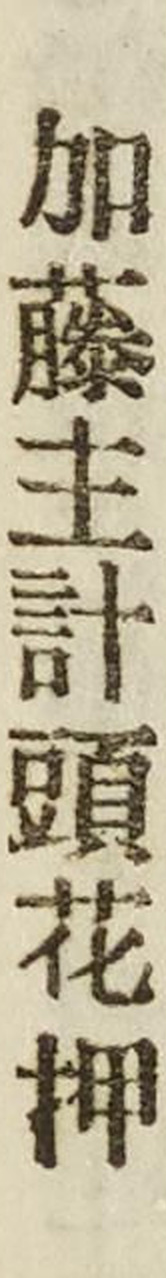加藤主計頭花押
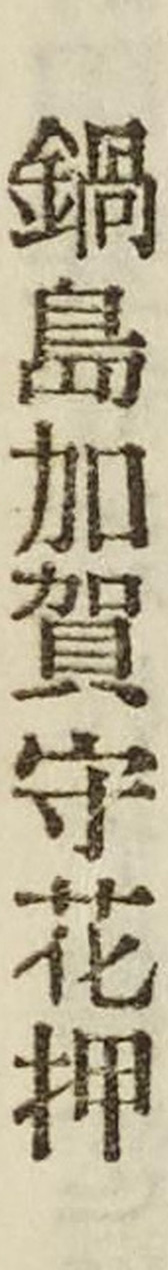鍋島加賀守花押
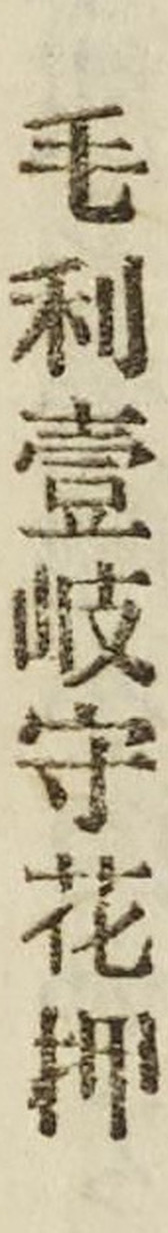毛利壱岐守花押
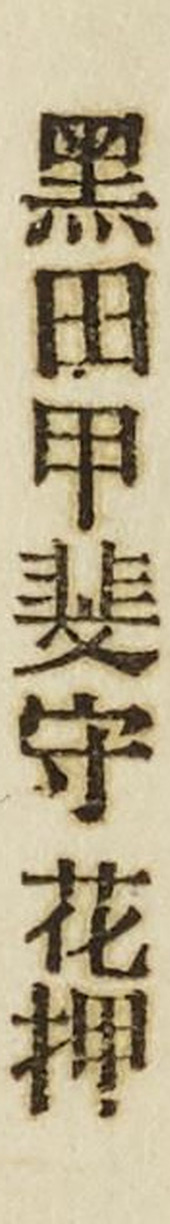黒田甲斐守花押
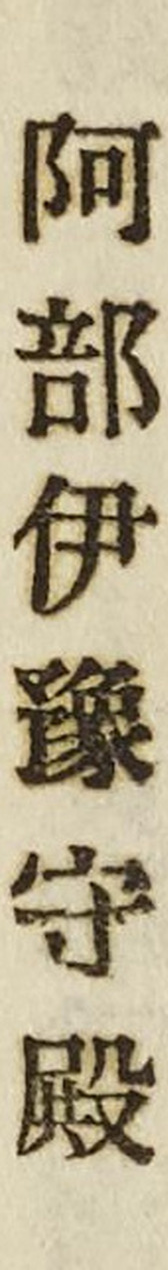阿部伊予守殿
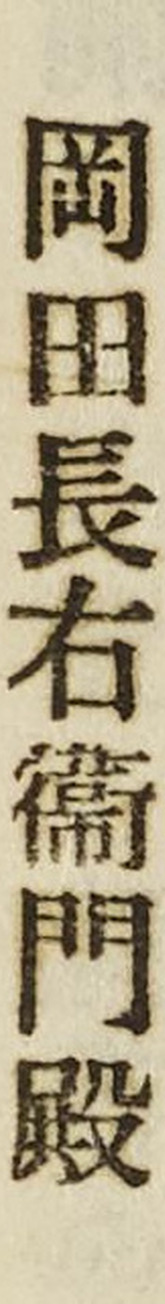岡田長右衛門殿
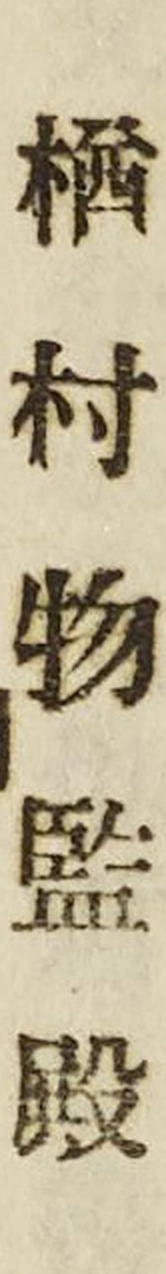楢村物監殿
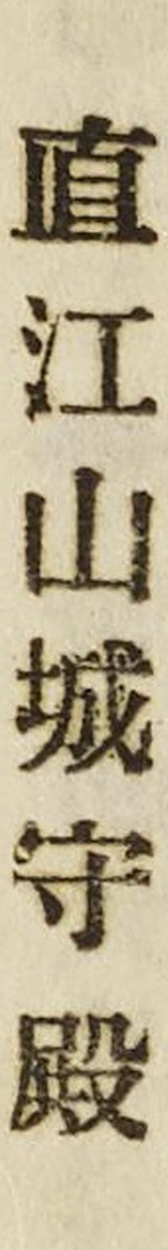直江山城守殿
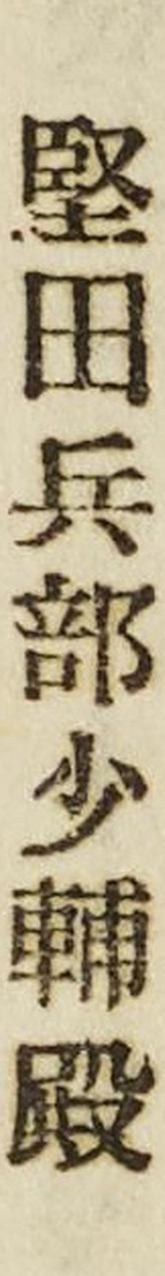堅田兵部少輔殿
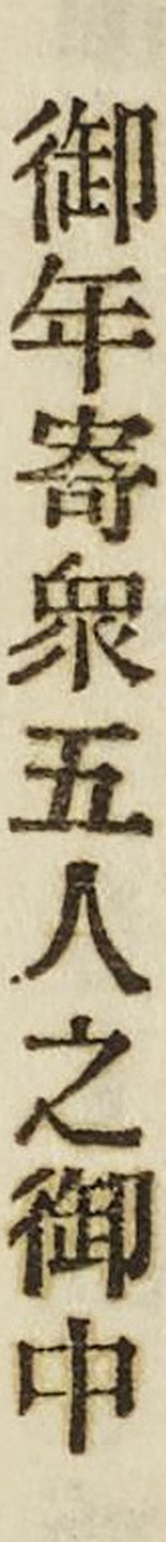御年寄衆五人之御中
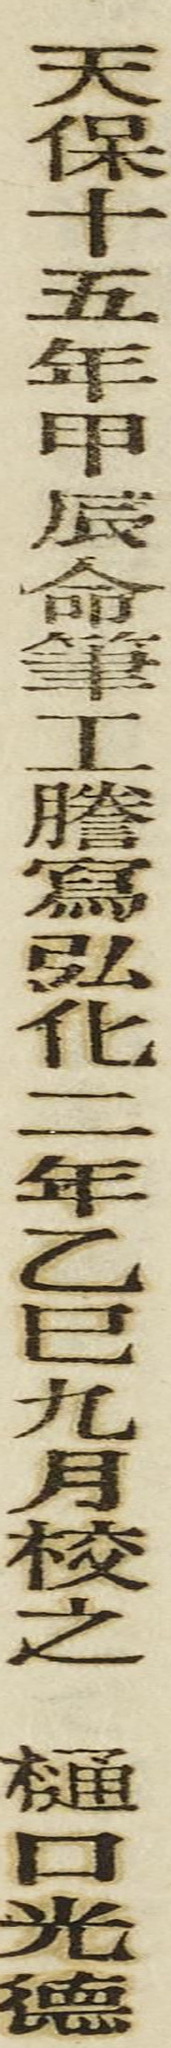天保十五年甲辰命筆工謄写弘化二年乙巳九月校之樋口光徳

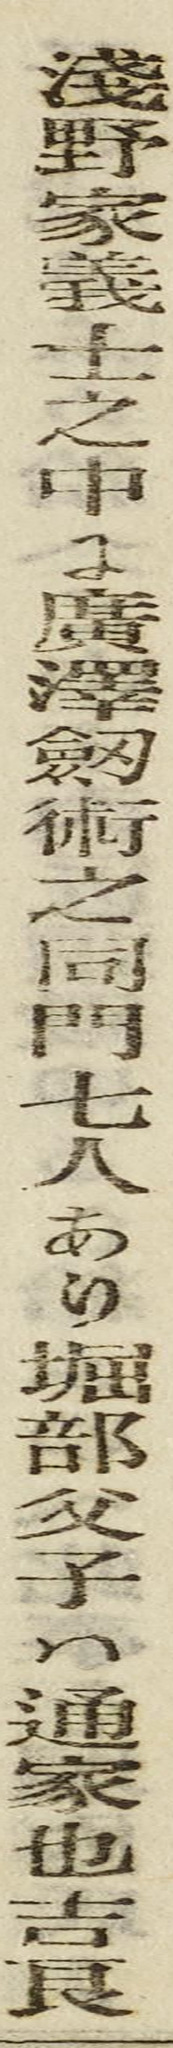浅野家義士之中に広沢剣術之同門七人あり堀部父子ハ通家也吉良
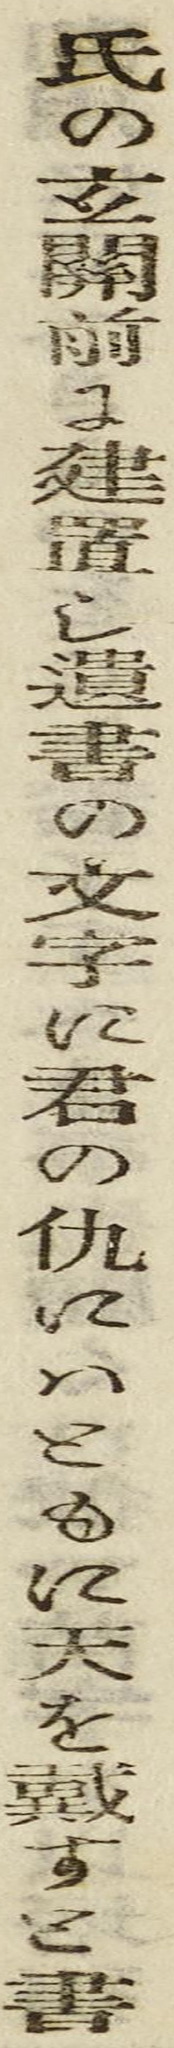氏の玄関前に建置し遺書の文字に君の仇にハともに天を戴すと書
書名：史籍集覽　朝鮮陣古文・細井廣澤記・颶風紀事・天明七年將軍宣下次第書　全
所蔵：東京大学地震研究所図書室 Earthquake Research Institute Library, The University of Tokyo, JAPAN
